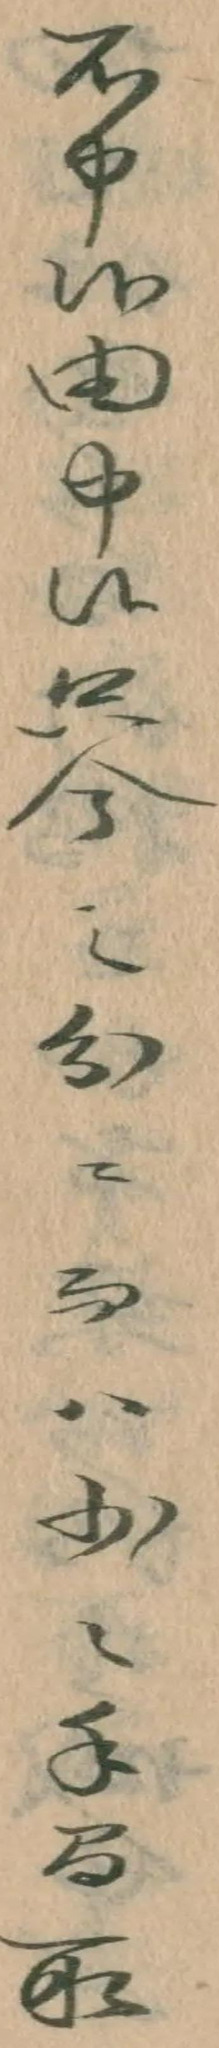不申候由申候只今之分に而は少々手間取
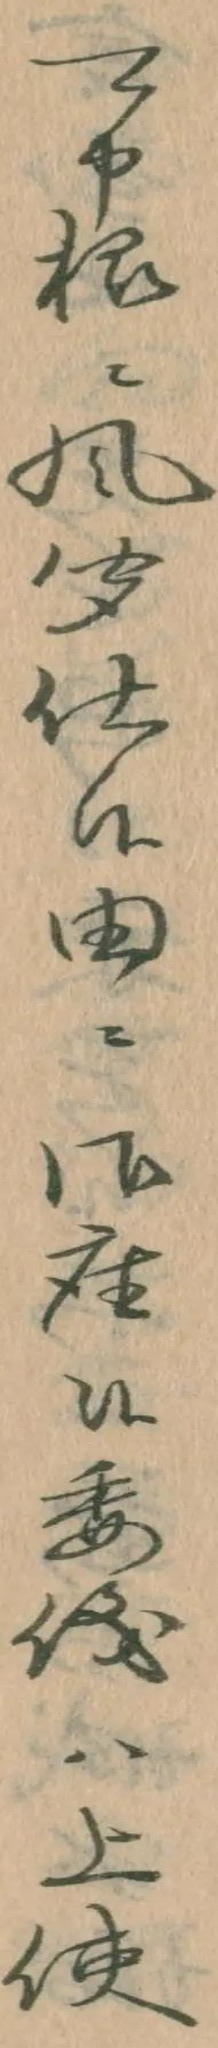可申様に風聞仕候由に御座候委儀は上使
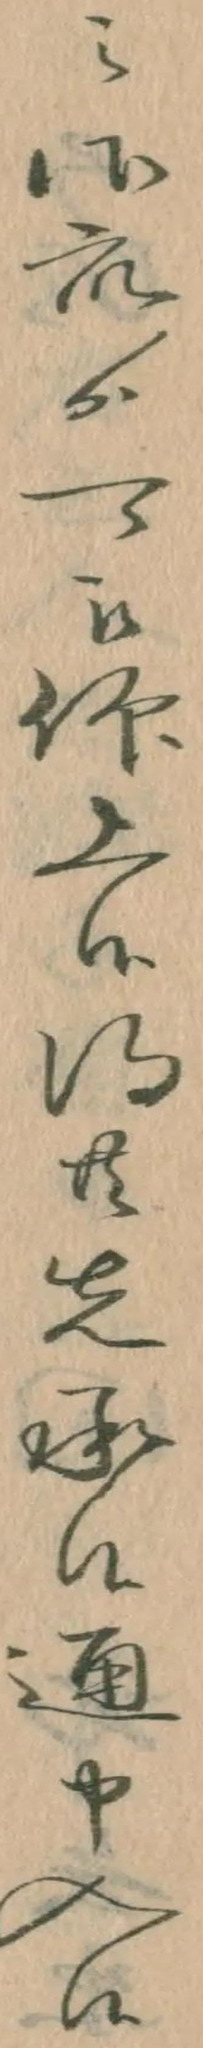之御衆ゟ可被仰上候得共先承候通申入候
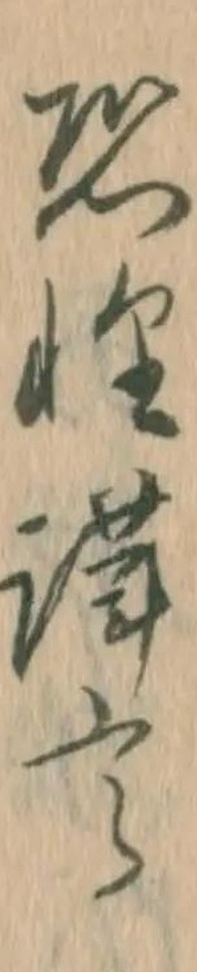恐惶謹言
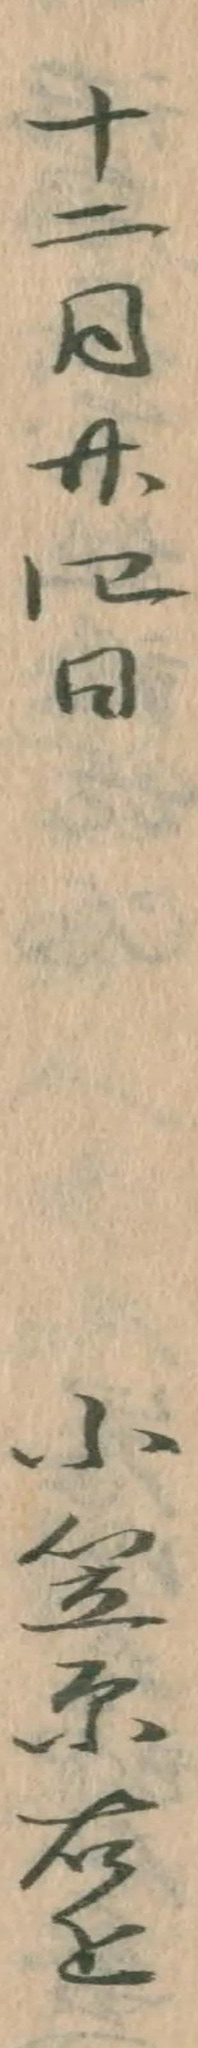十二月廿四日小笠原右近
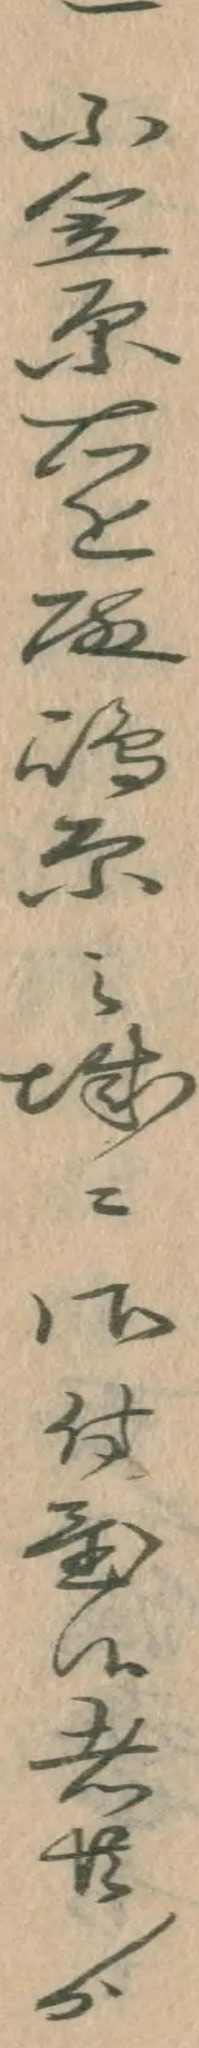一小笠原右近殿島原之城に御付置候者共ゟ
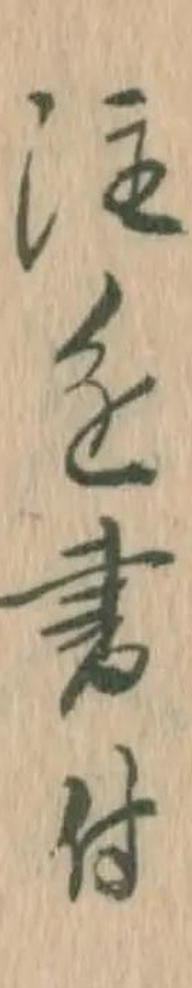注進書付
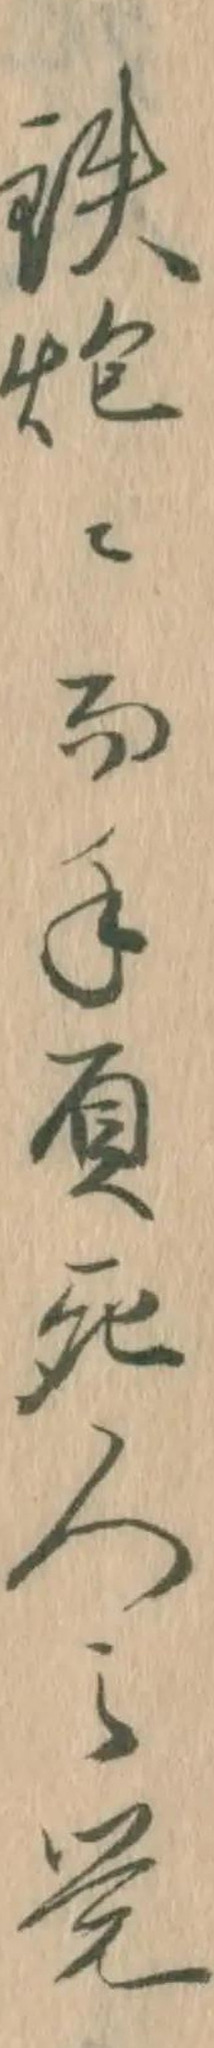鉄炮に而手負死人之覚
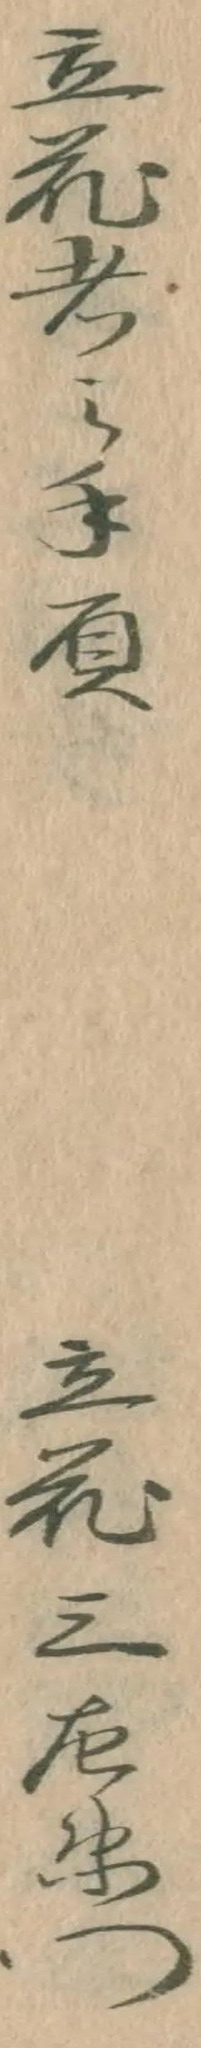立花者之手負立花三左衛門
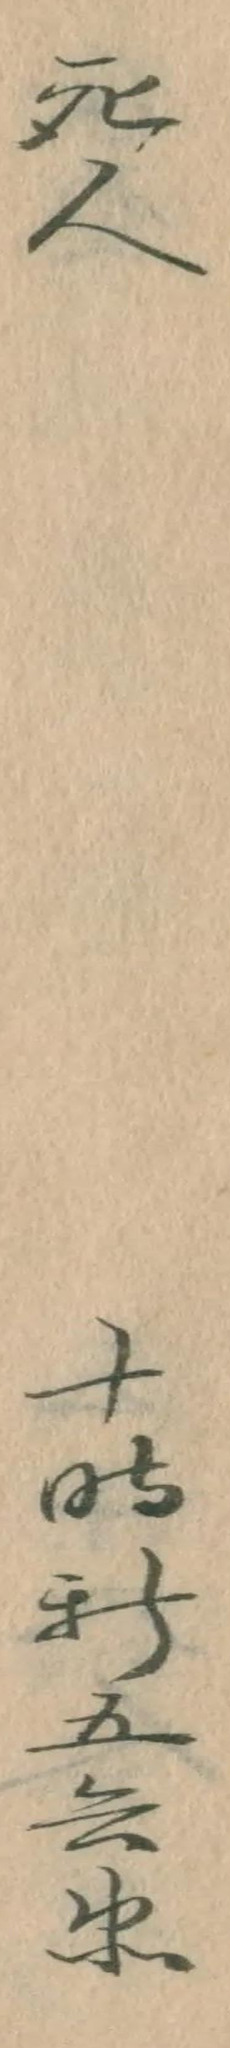死人十時新兵衛
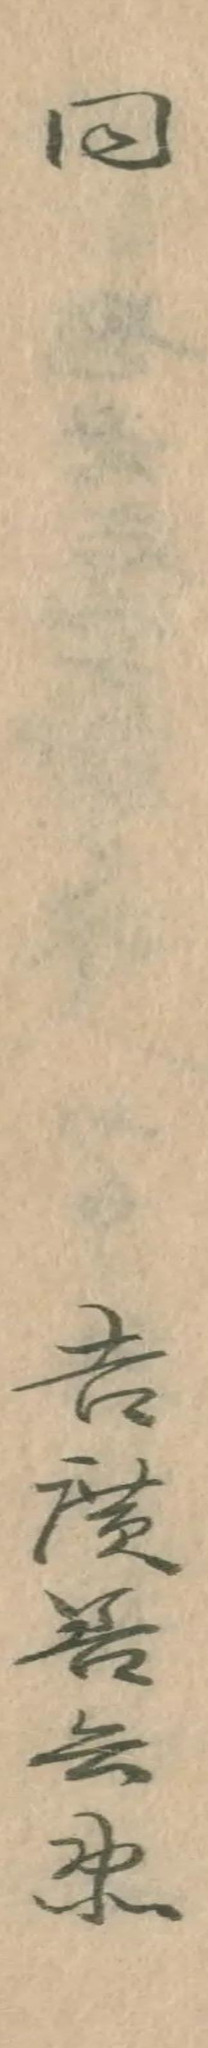同吉広善兵衛

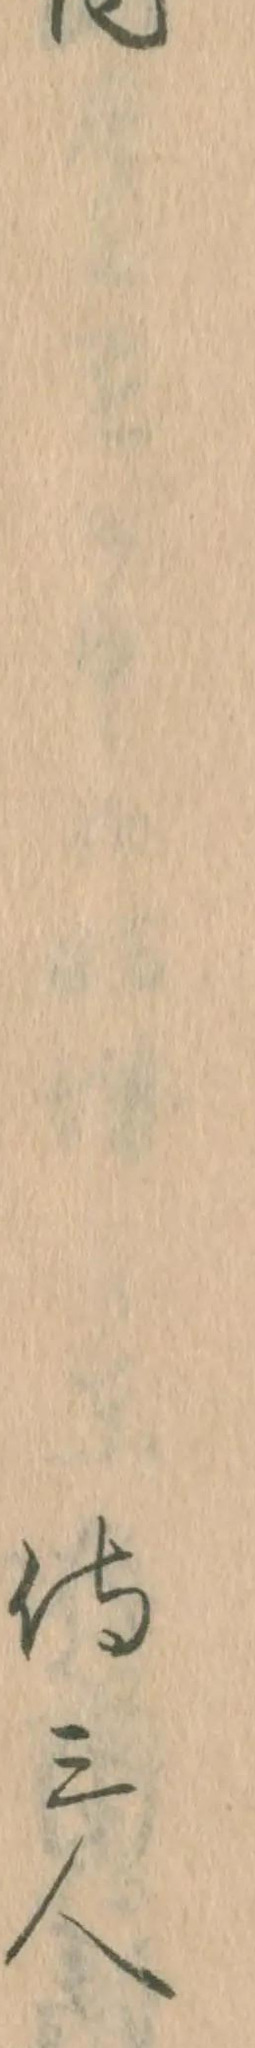同侍三人
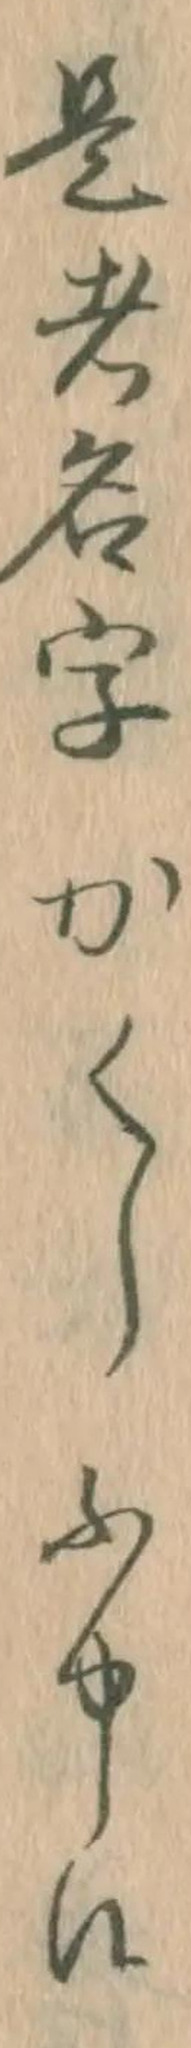是者名字かくし不申候
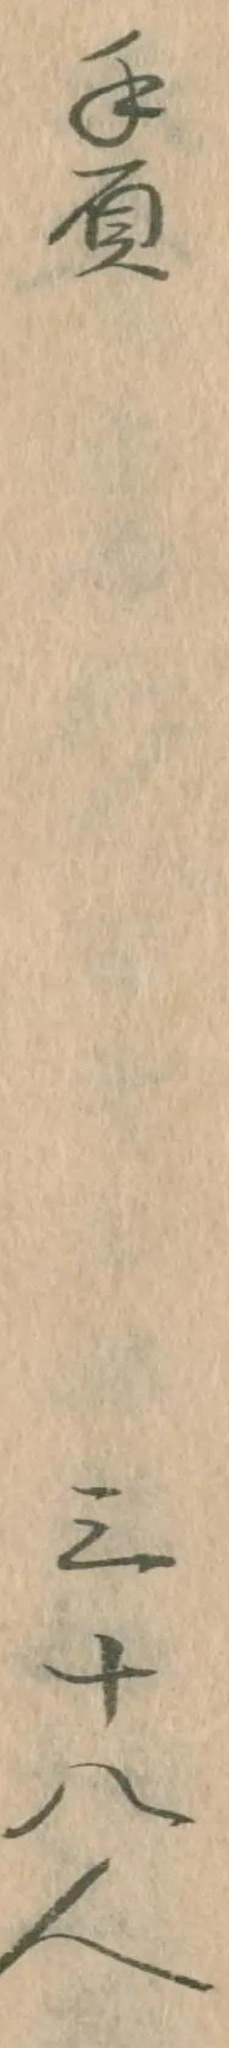手負三十八人
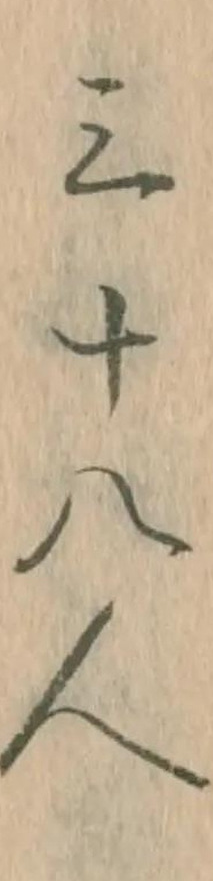手負三十八人
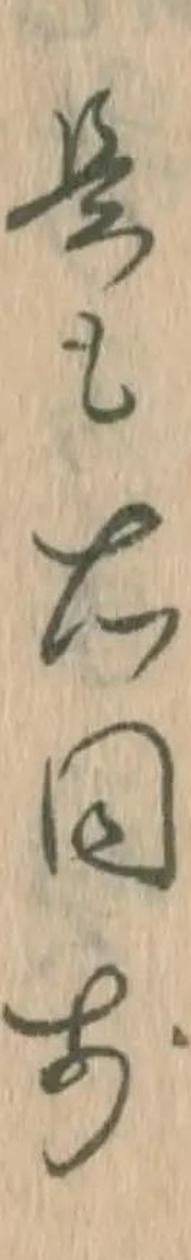是も右同前
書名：切支丹御退治記 49巻. [4]
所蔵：国立国会図書館 National Diet Library, JAPAN
